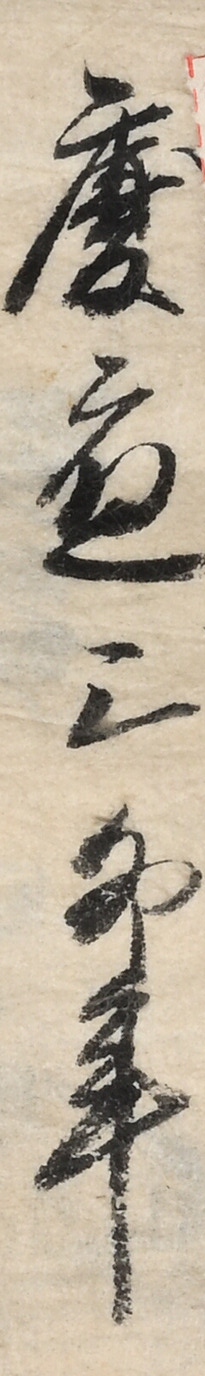慶応三卯年
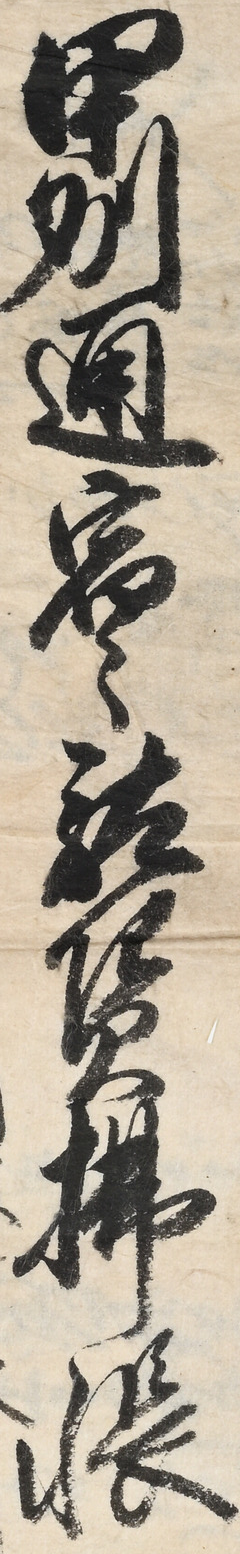甲州通宿々駄賃払帳
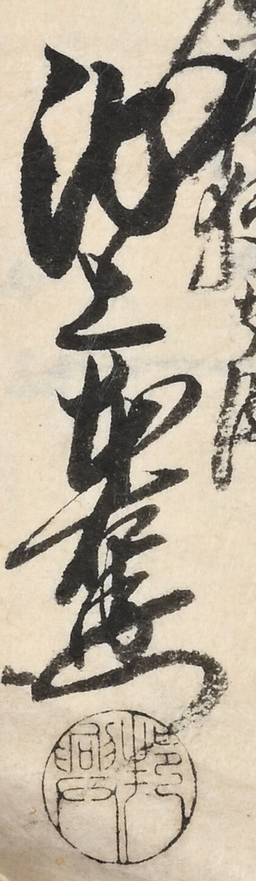池上本右衛門印

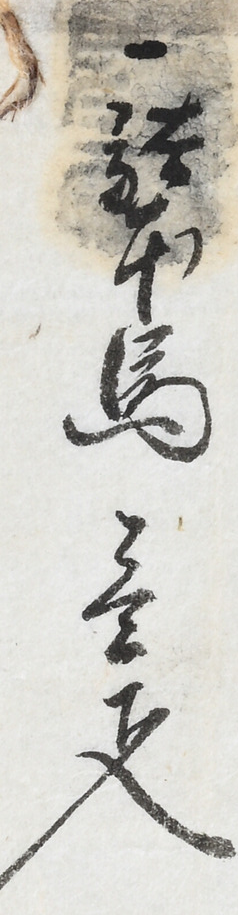一駄本馬壱疋
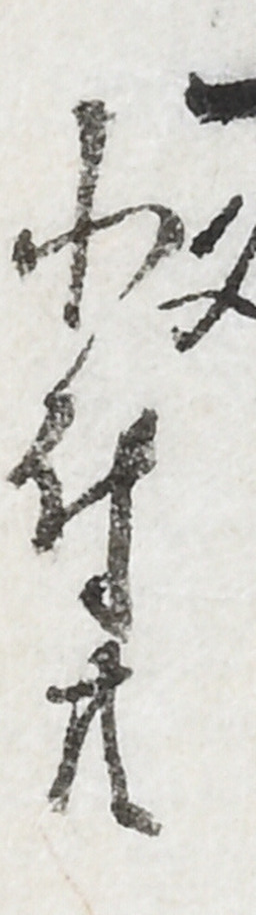小付共
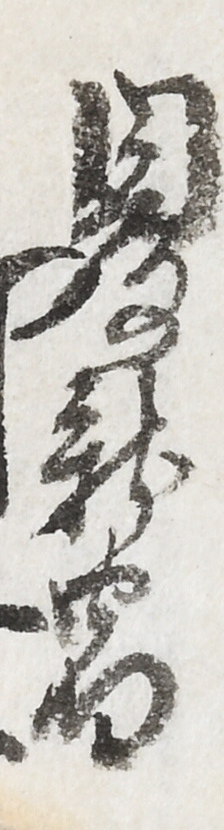内藤新宿
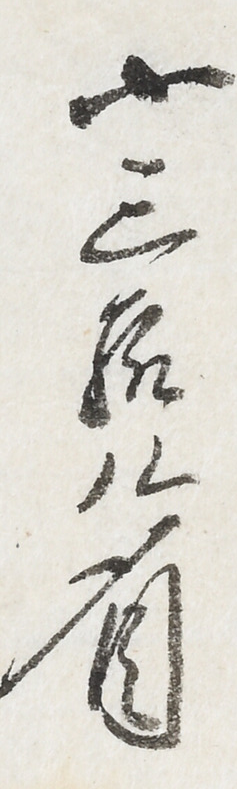〆三拾八〆目
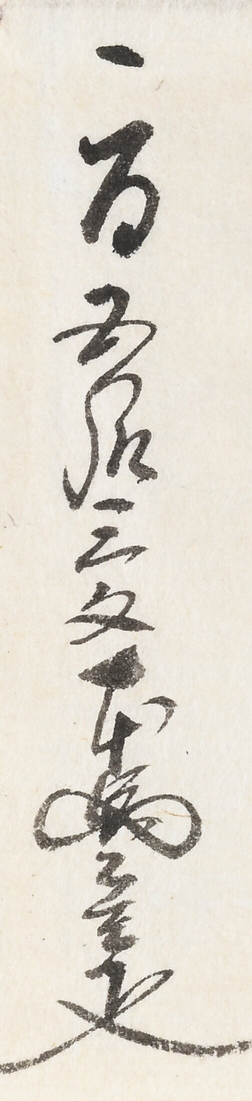一百五拾三文本馬壱疋
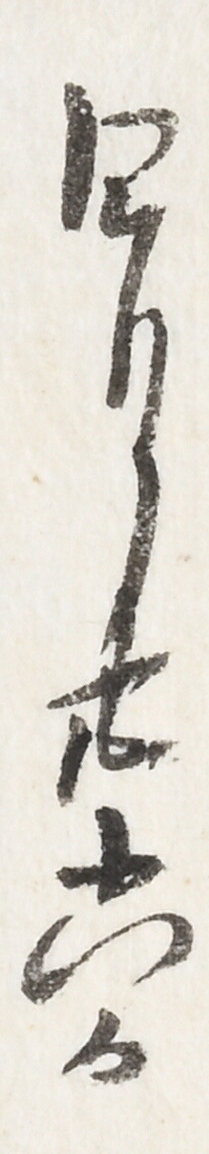四月廿六日

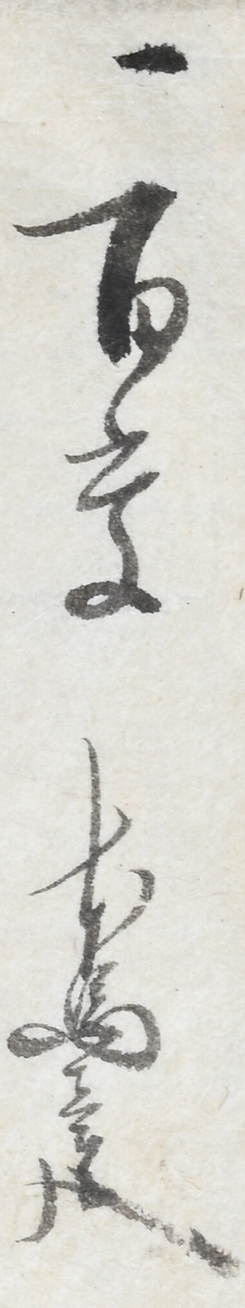一百六文本馬壱疋
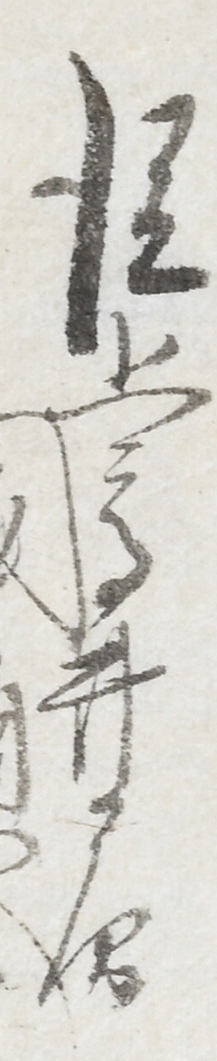従上高井戸宿
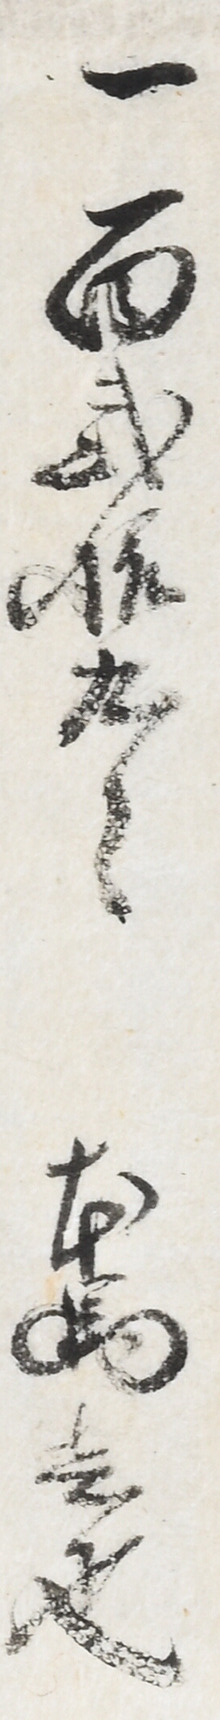一百弐拾九文本馬壱疋
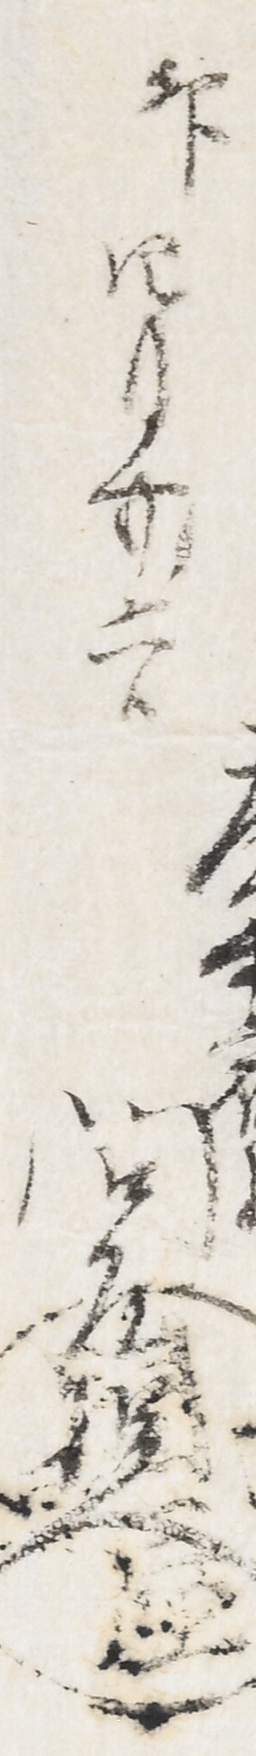四月廿六日問屋役人印
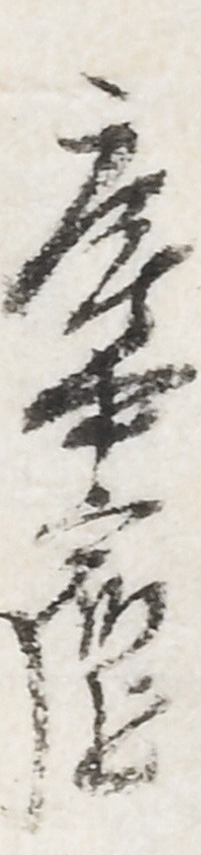府中宿迄
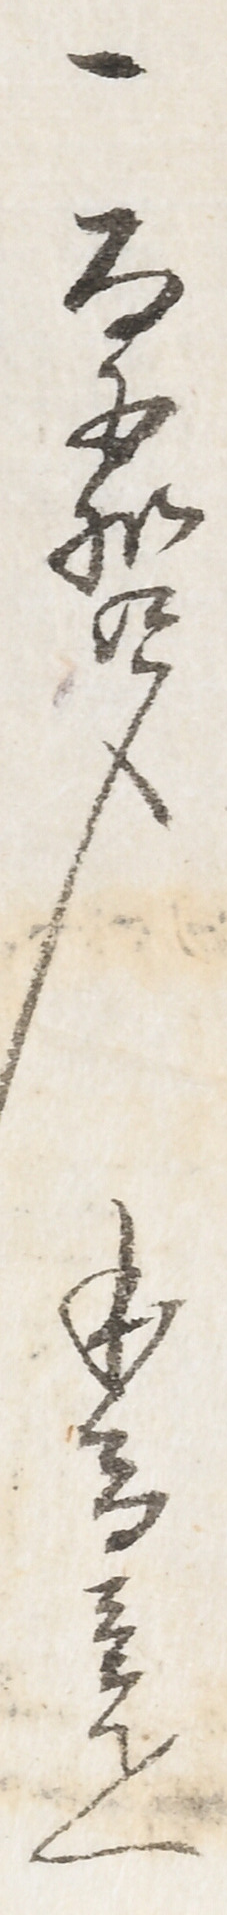一百五拾四文本馬壱疋
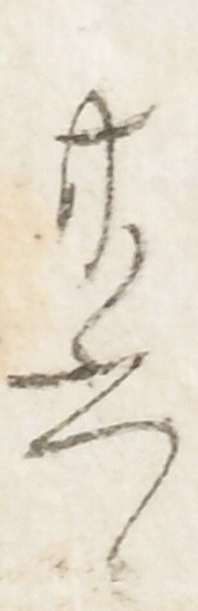廿六日
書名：甲州通宿々駄賃払帳
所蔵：伊那市立高遠町図書館・合同会社AMANE
